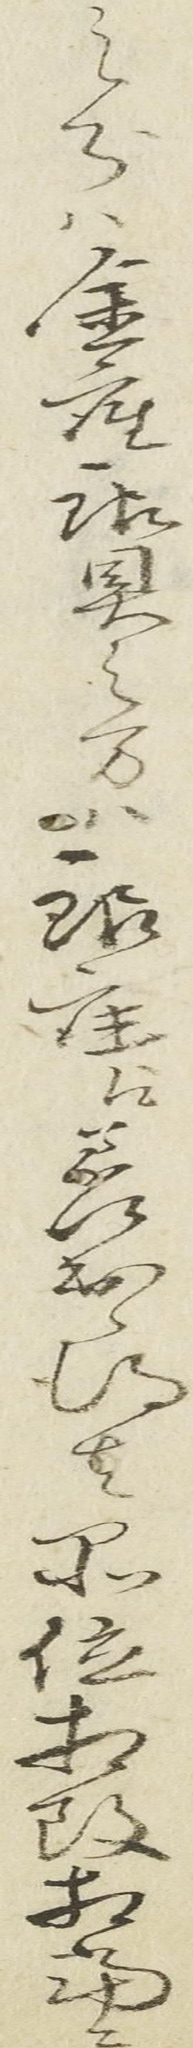の分は金座銀具之分ハ銀座え差出候得は品位相改相当ニ
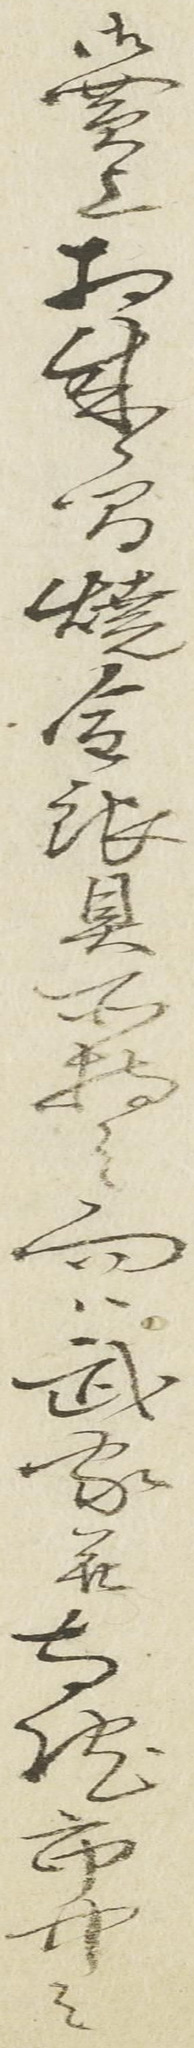御買上相成候間焼金銀具所持之向ハ武家并寺院市中之
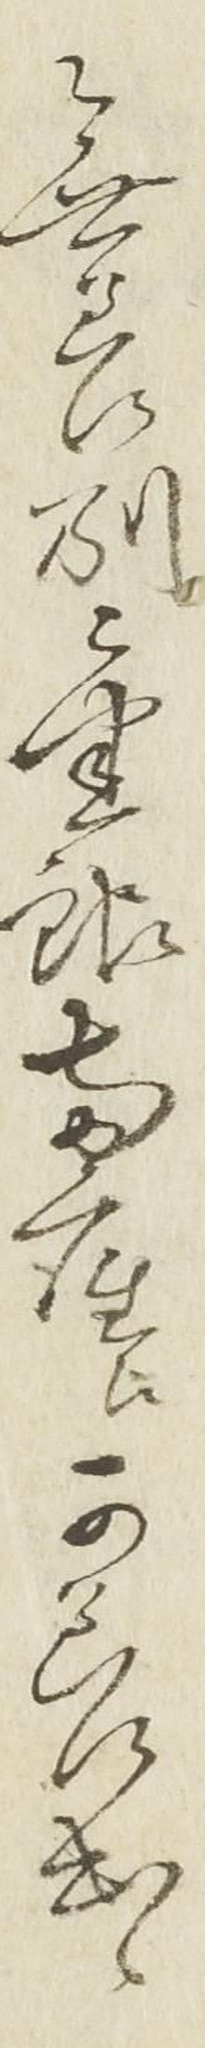無差別金銀両座え可差出候
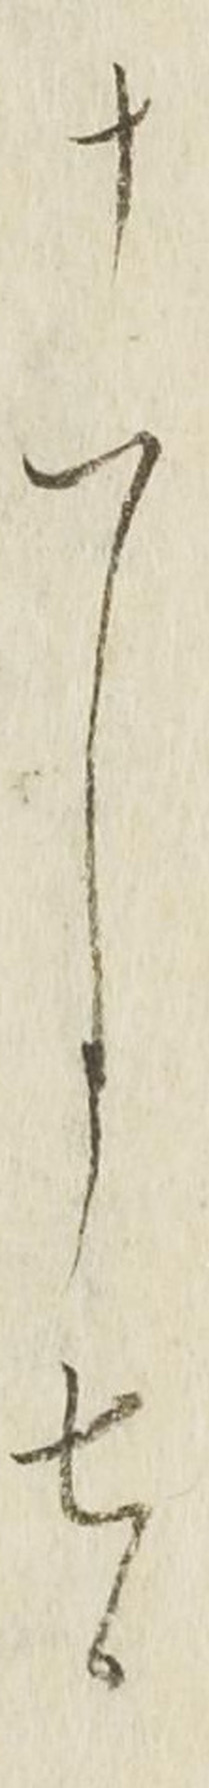十一月七日
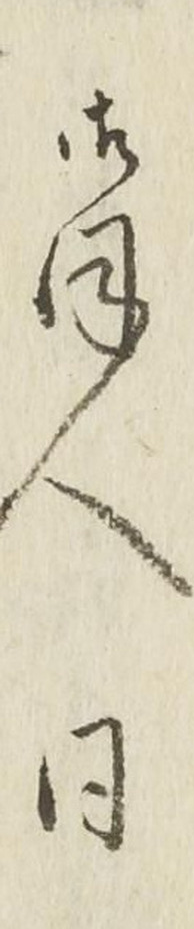御同人同
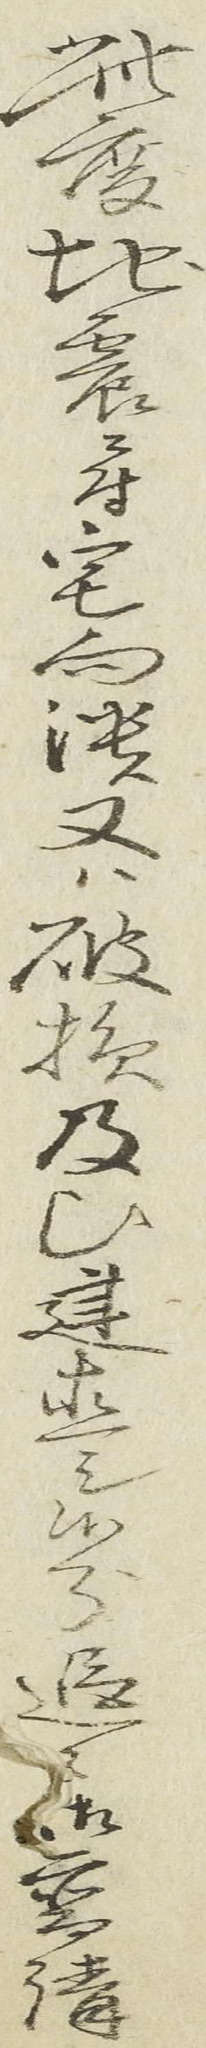此度地震ニ付宅向潰又ハ破損及ひ建直シ候分追々御普請
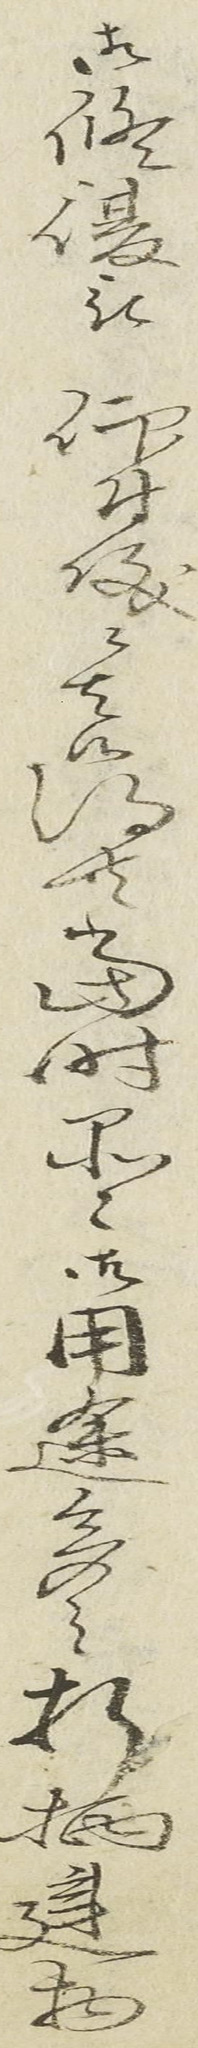御修復被仰付儀ニは候得共当時品々御用途多々折柄建物
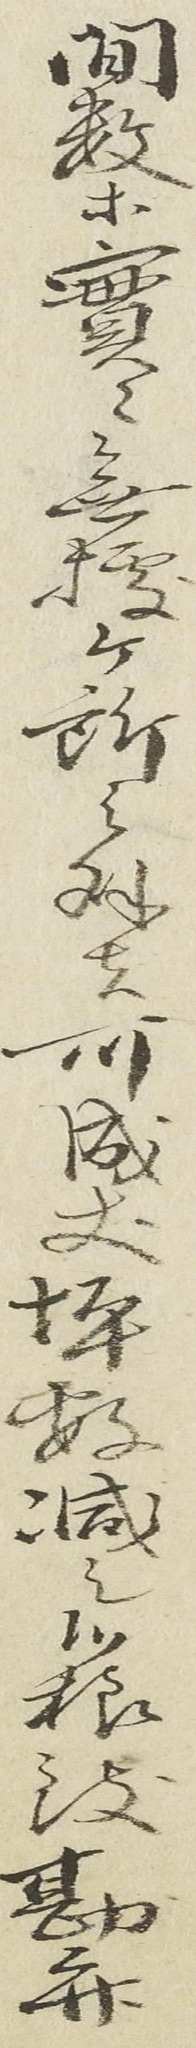間数等実々無拠ケ所之外は可成丈坪数減シ候様致勘弁
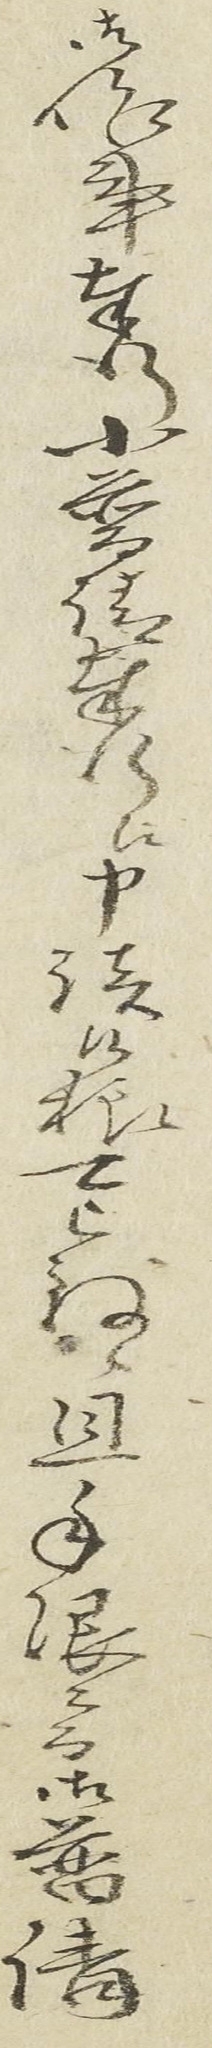御作事奉行小普請奉行え申談候様可被致候且年限ニ而御普請
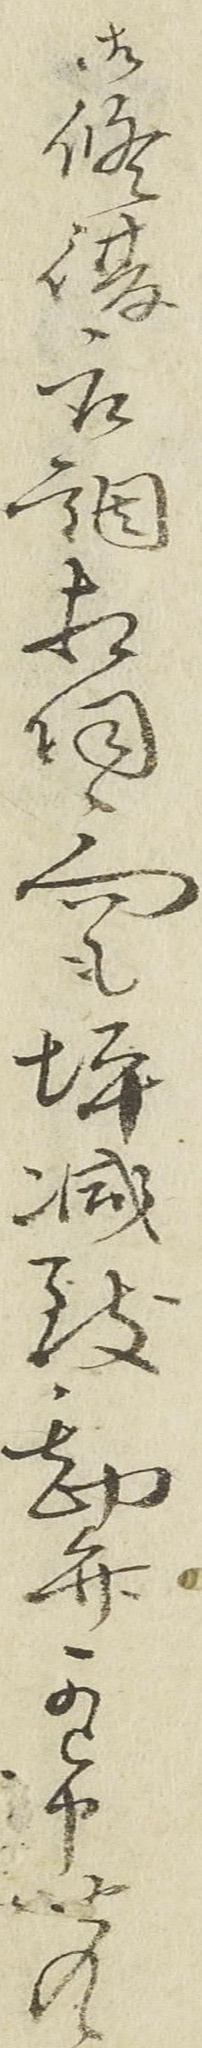御修復取調相伺候向も坪減致勘弁可被申聞候

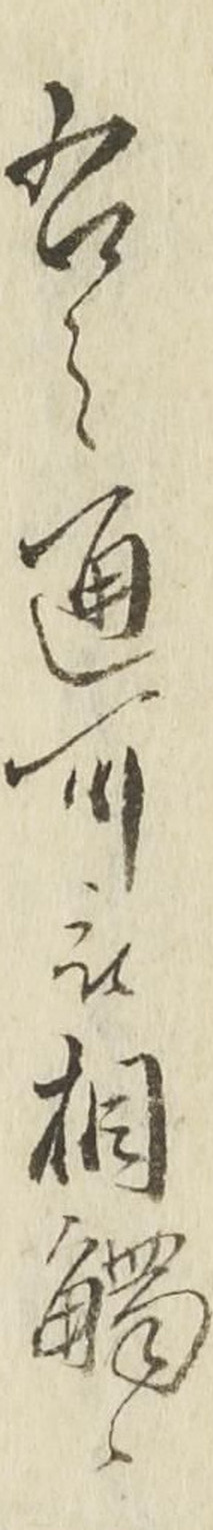右之通可被相触候
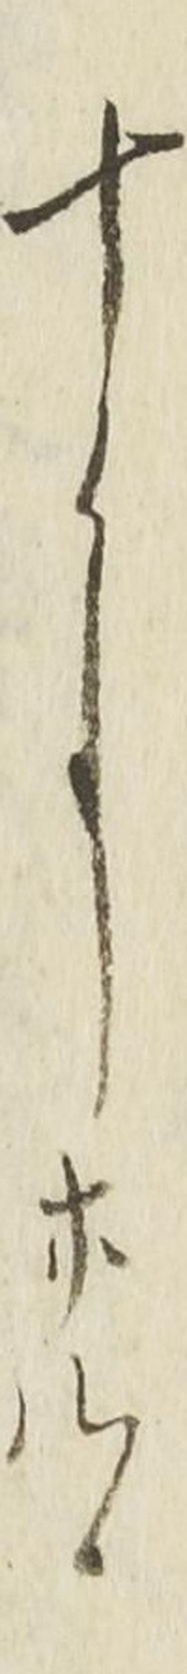十月廿八日
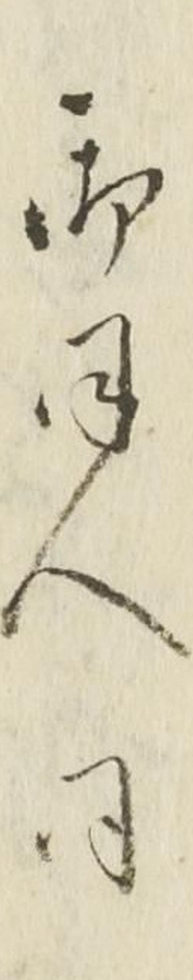御同人同
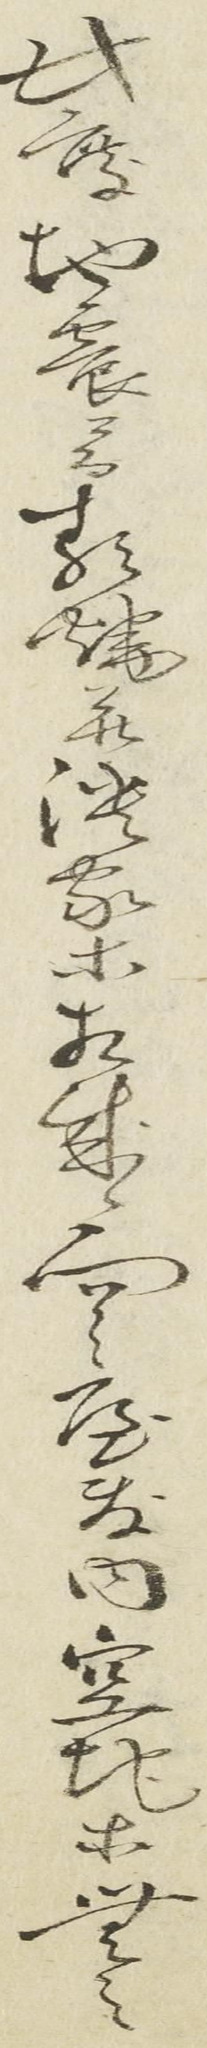此度地震ニ而類焼并潰家等相成候向々屋敷内空地等無之
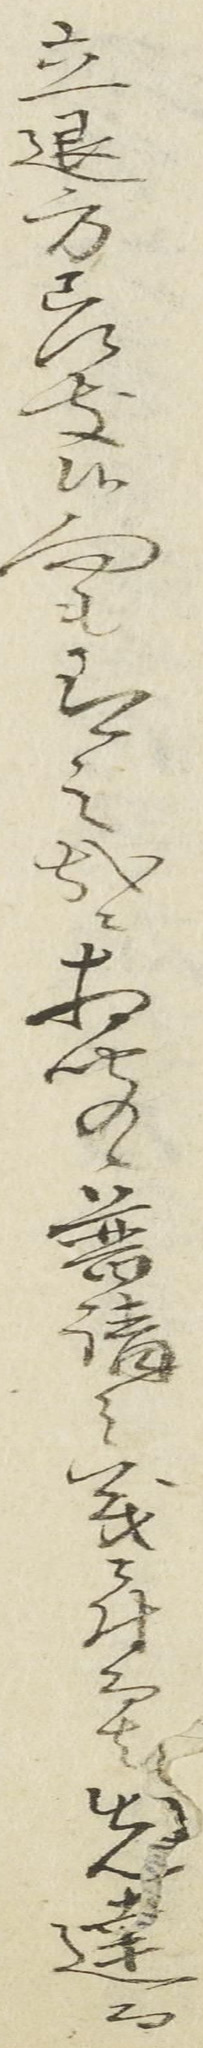立退方差支候向も有之哉ニ相聞候普請之義ニ付而は先達而
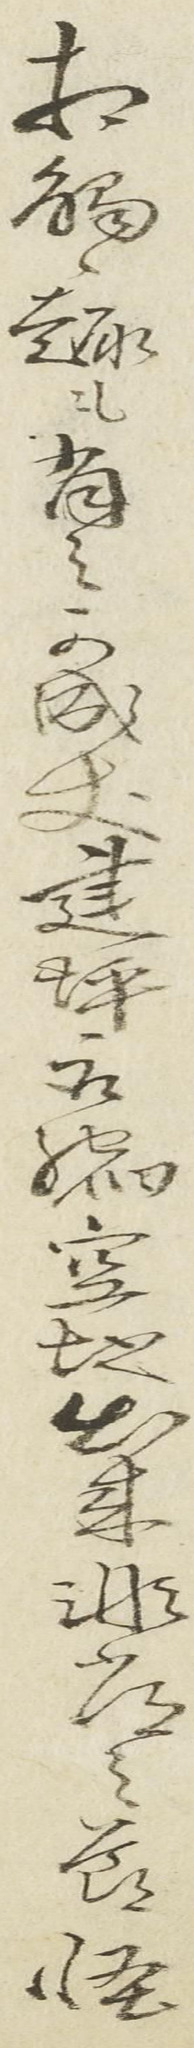相触候趣も有之可成丈建坪取縮空地出来非常之節怪
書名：安政二乙卯年十月二日大地震之事
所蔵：東京大学地震研究所図書室 Earthquake Research Institute Library, The University of Tokyo, JAPAN
